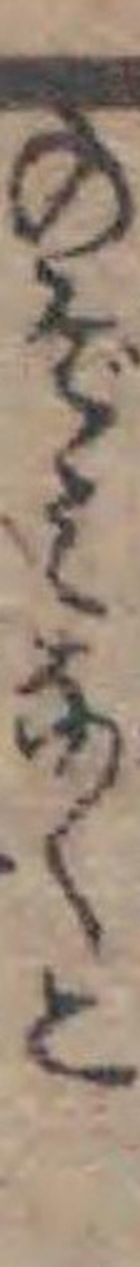のぞみなくこ
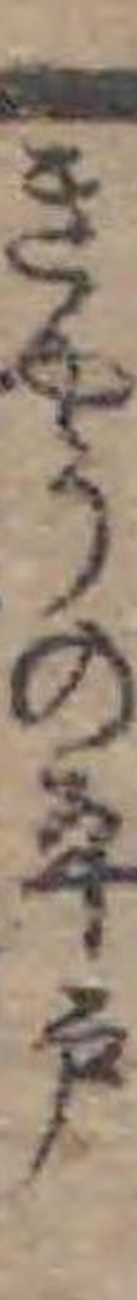きやうの平戸
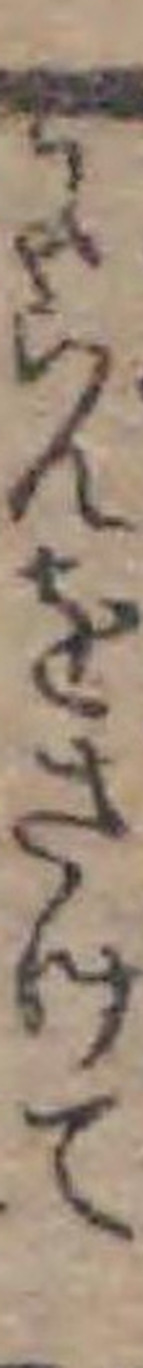にらんをさけて
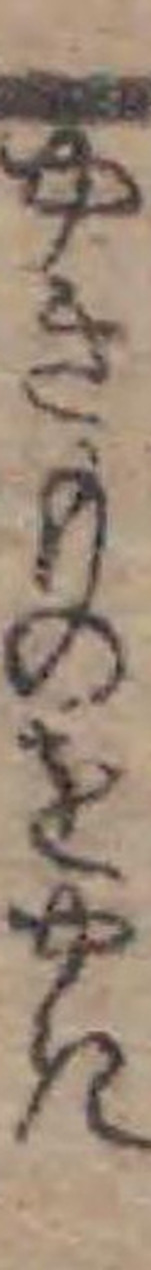やきものをやき
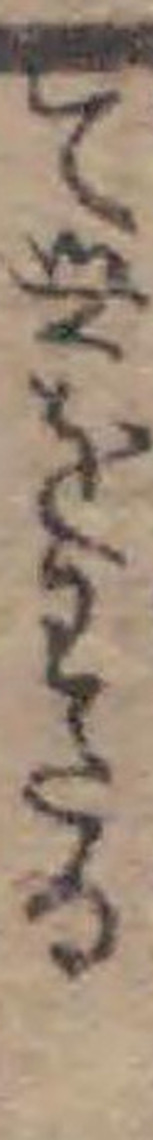て世をわたる
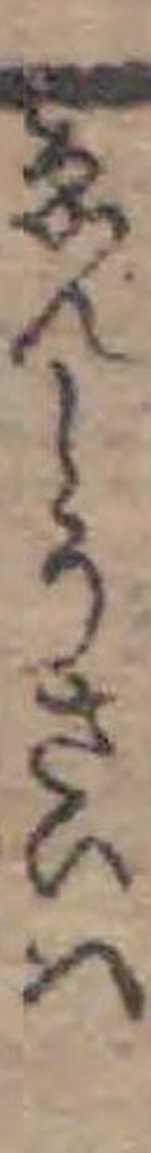ゑんしうさいは
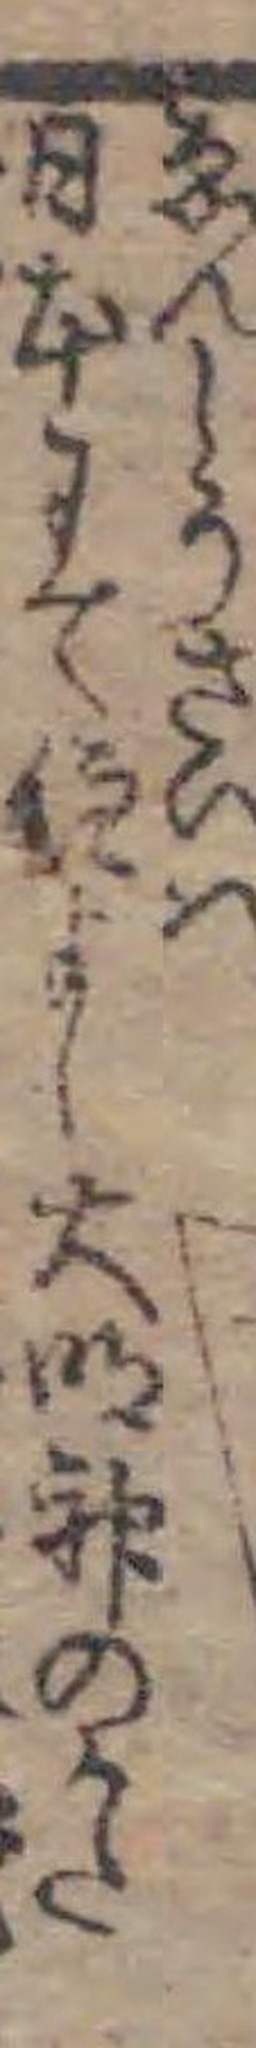日本にて住よし大明神のかた
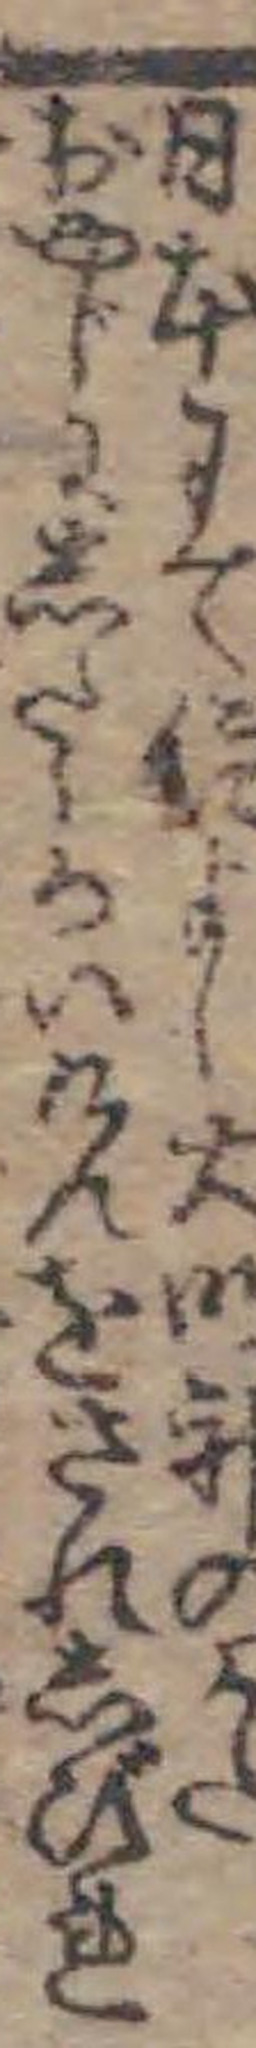おやじにしたゝかいけんをされしびれ
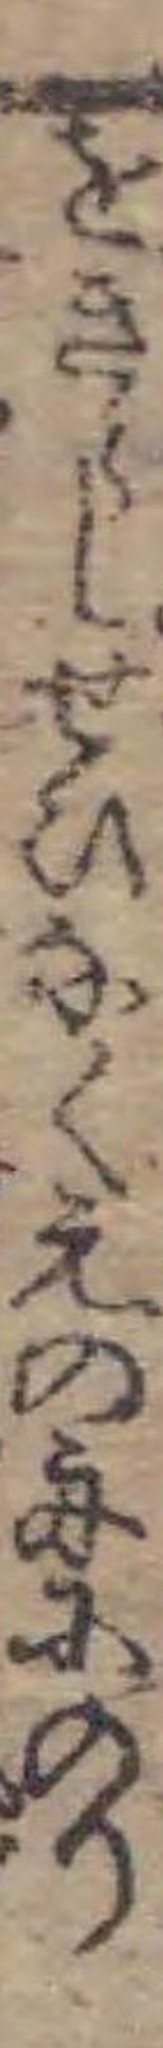をきらしせひなく元の舟にのり
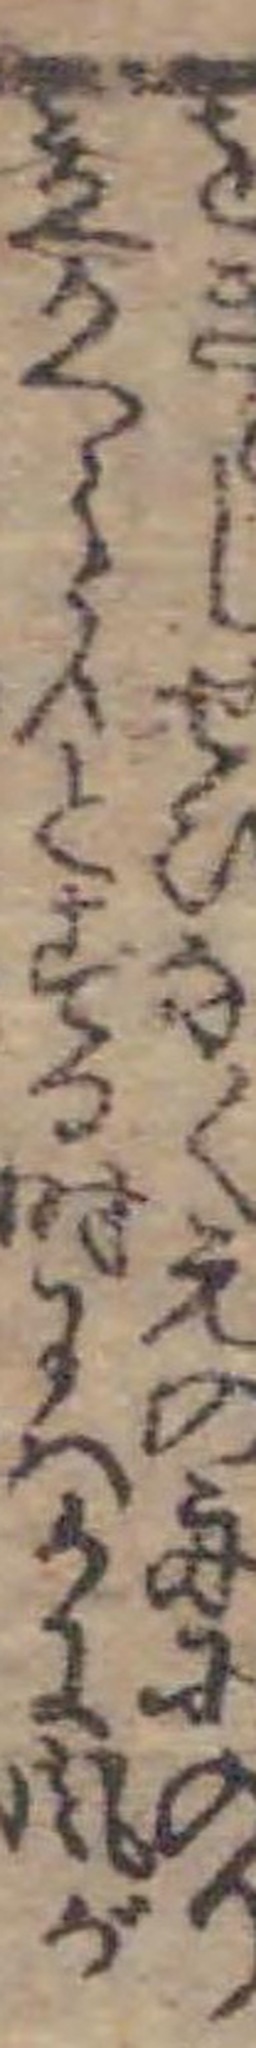立かへらんとする時にはかに風が
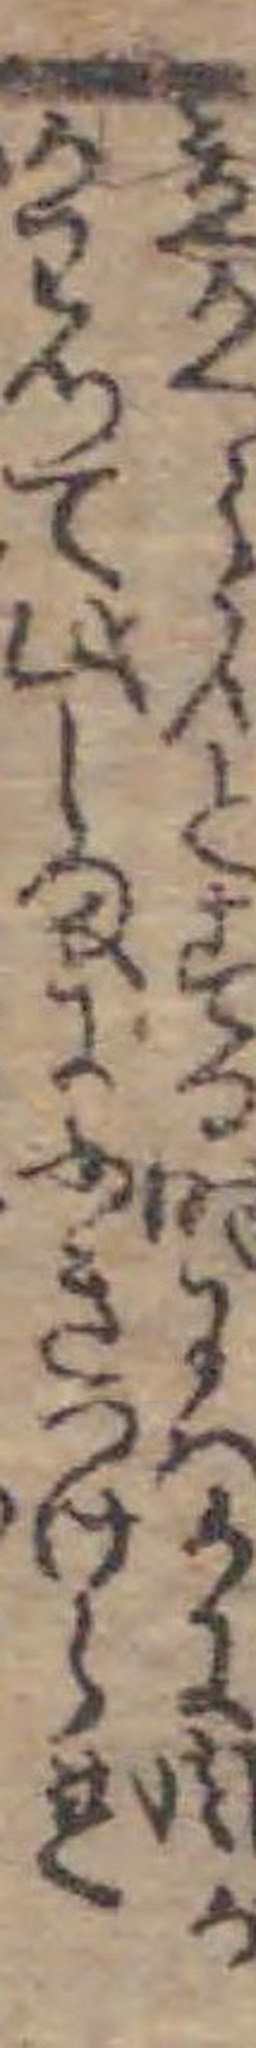かわつて此しまにふきつけられ
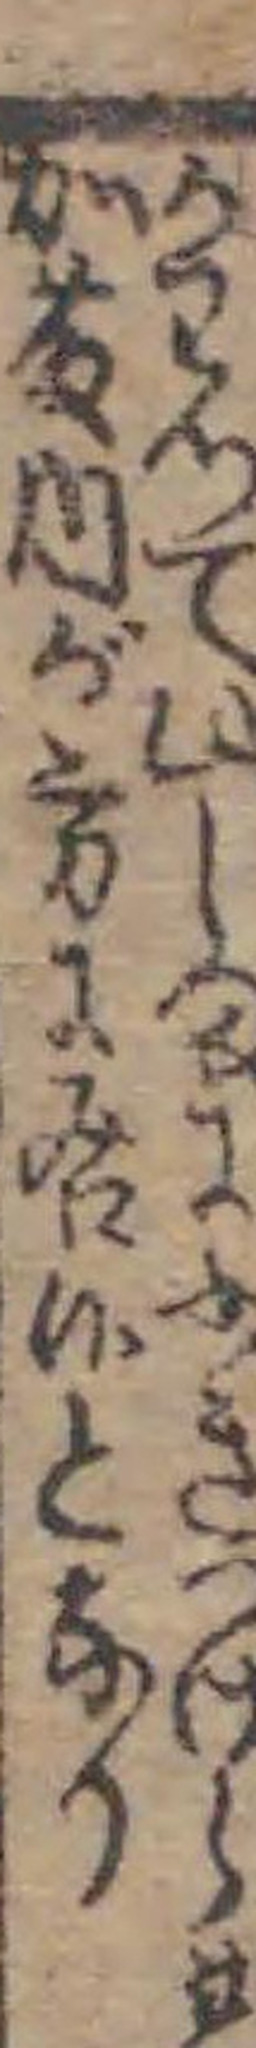加藤内が方に居候となり
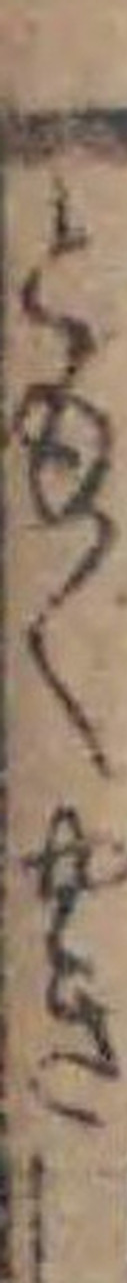とも〳〵やき
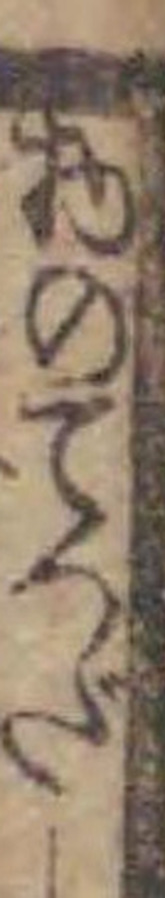物のてつだ
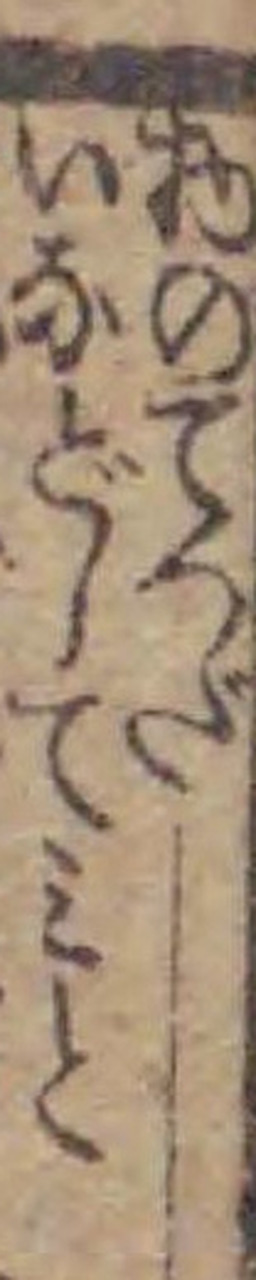いなどしてみと
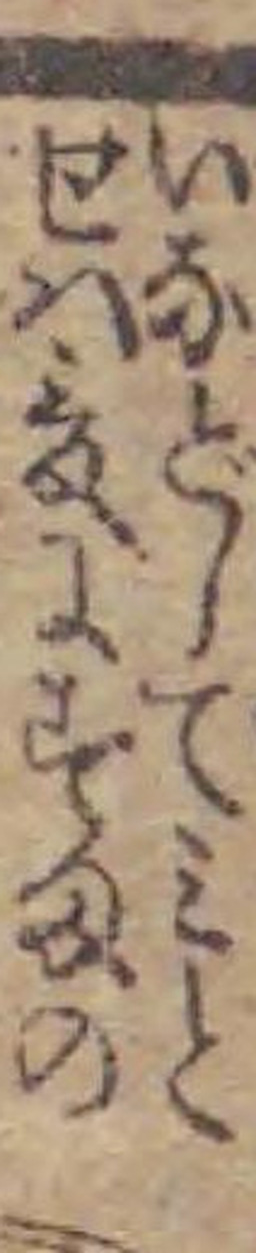せは爰にすまの
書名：此奴和日本 : 2巻
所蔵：国立国会図書館 National Diet Library, JAPAN
